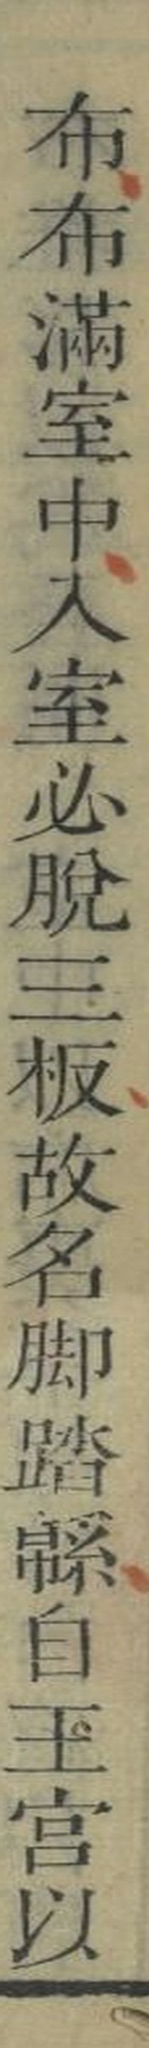布布満室中入室必脱三板故名脚踏綿自王宮以
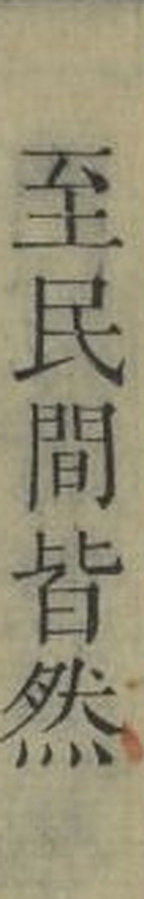至民間皆然
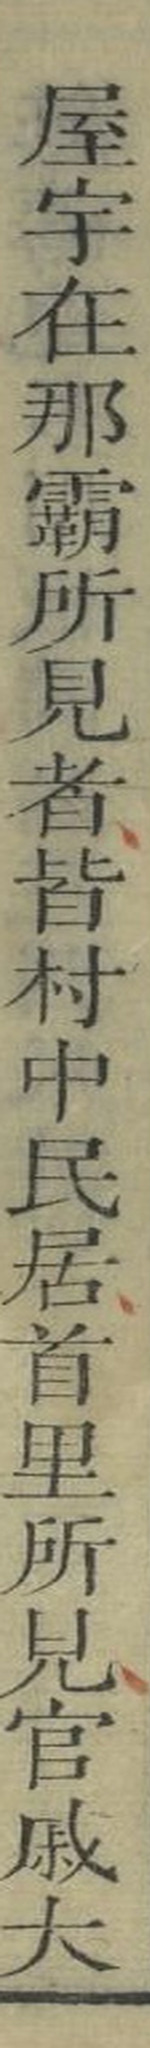屋宇在那霸所見者皆村中民居首里所見官戚大
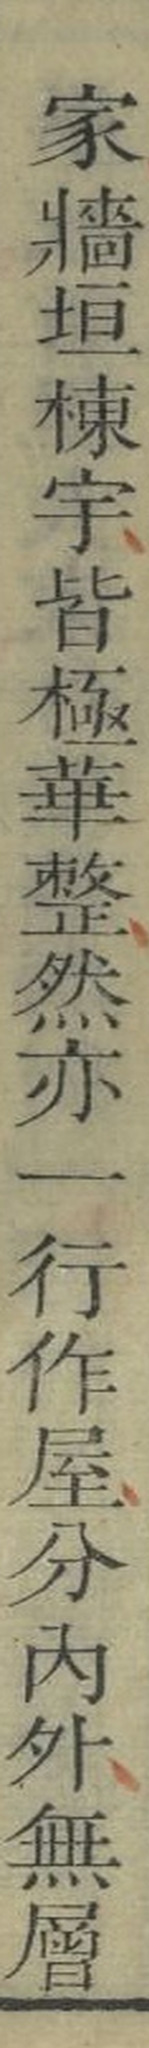家牆垣棟宇皆極華整然亦一行作屋分内外無層
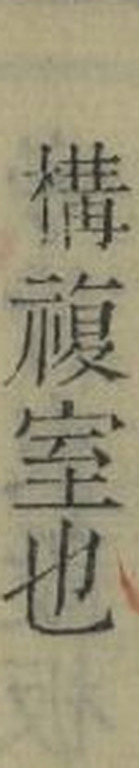構複室也
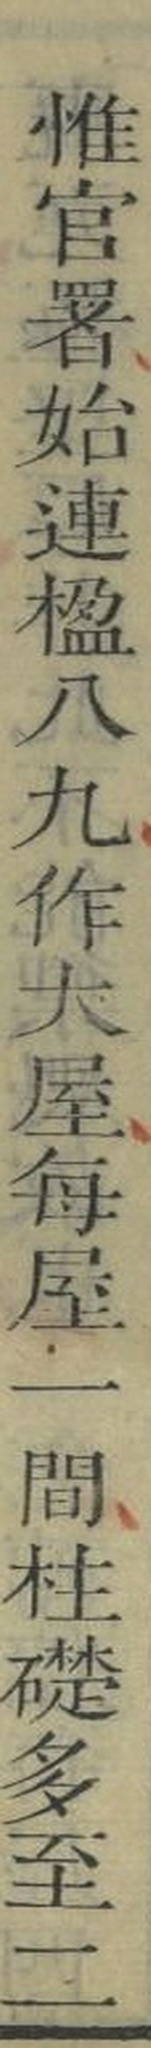惟官署始連楹八九作大屋毎屋一間柱礎多至二
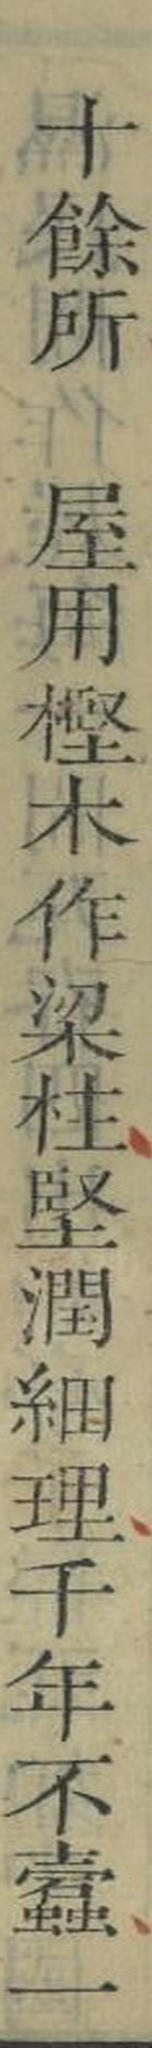十余所屋用樫木作梁柱堅潤細理千年不蠧一
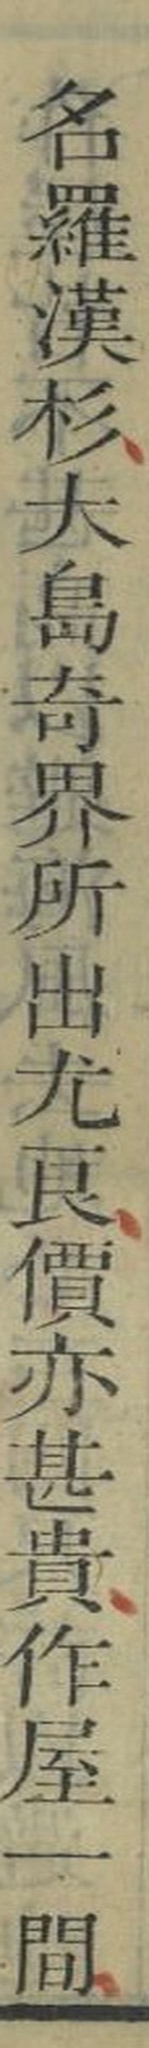名羅漢杉大島奇界所出尤良価亦甚貴作屋一間
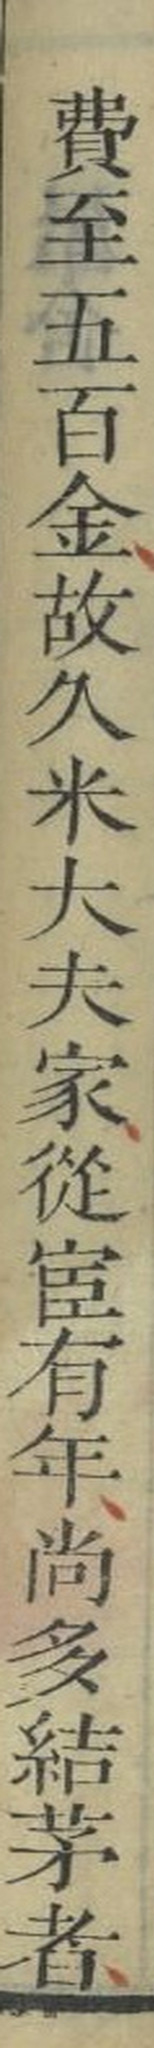費至五百金故久米大夫家従宦有年尚多結茅者
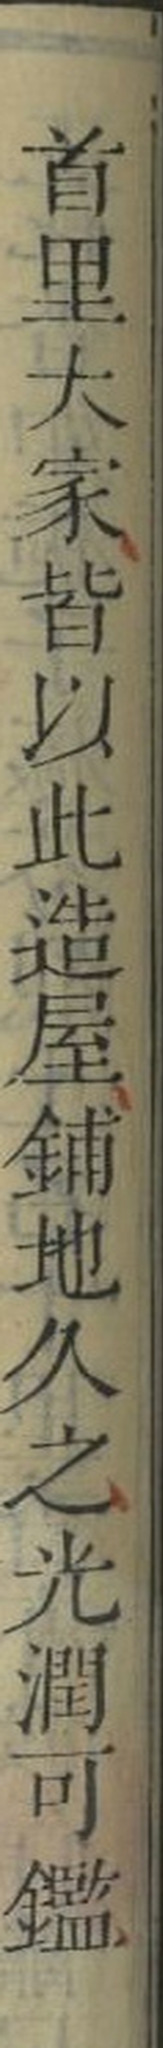首里大家皆以此造屋鋪地久之光潤可鑑
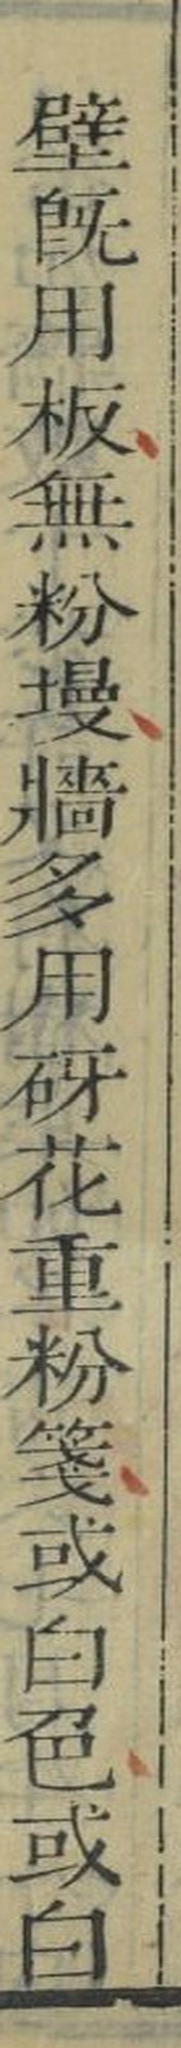壁既用板無粉墁牆多用砑花重粉箋或白色或白
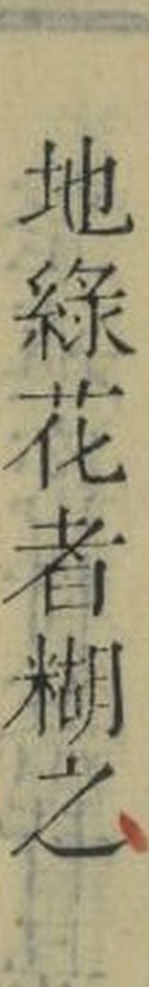地緑花者糊之
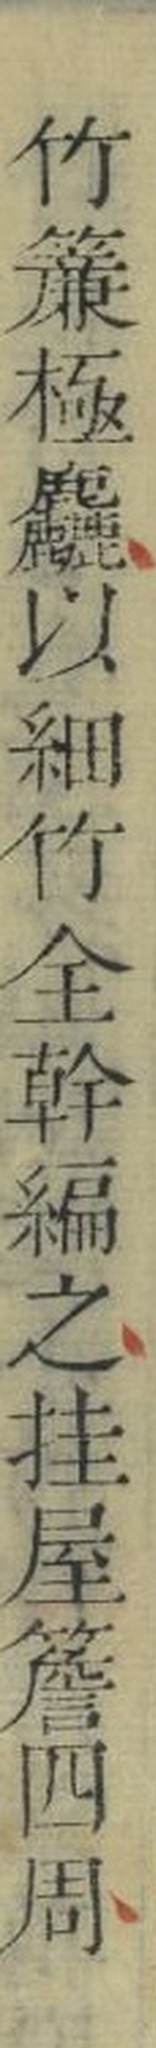竹簾極麤以細竹全幹編之挂屋簷四周
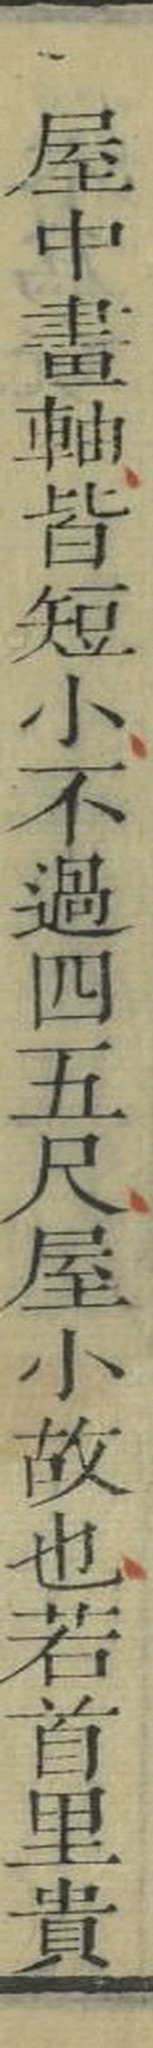屋中画軸皆短小不過四五尺屋小故也若首里貴
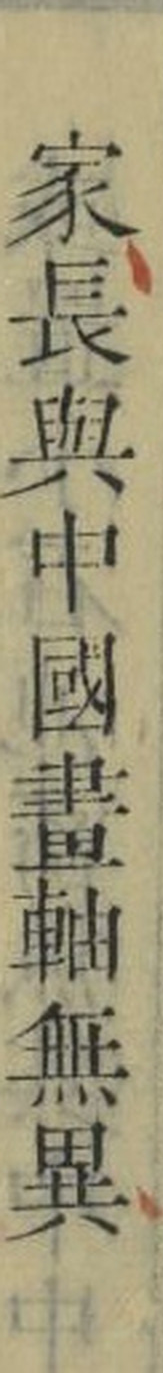家長与中国画軸無異
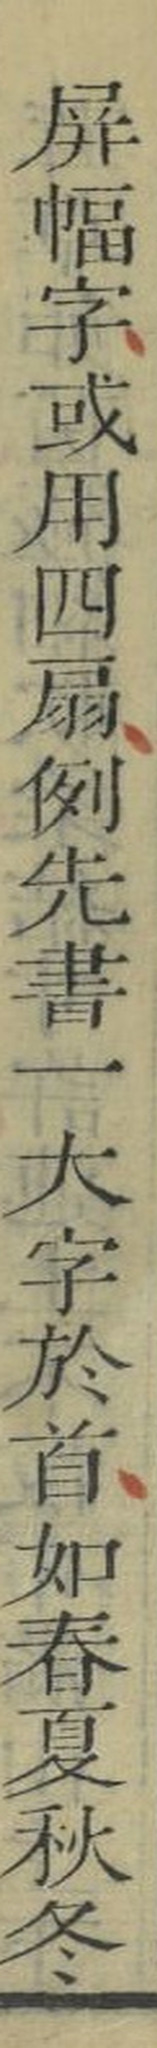屛幅字或用四扇例先書一大字於首如春夏秋冬
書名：中山伝信録 巻六
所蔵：University of the Ryukyus Library
